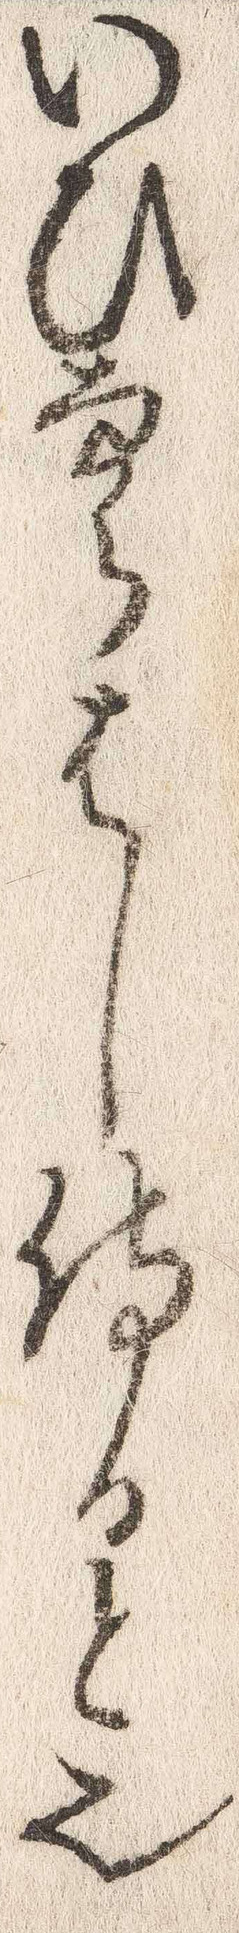いひならはし侍ると也
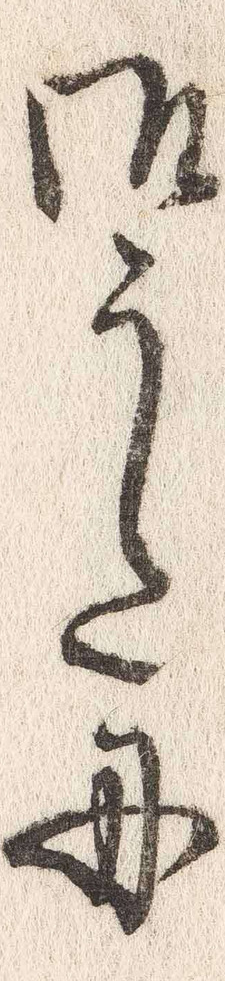御うたに
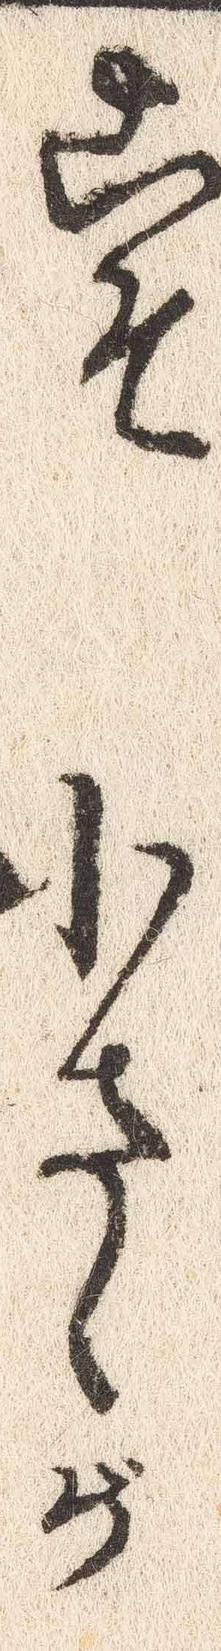こそ小さゝが
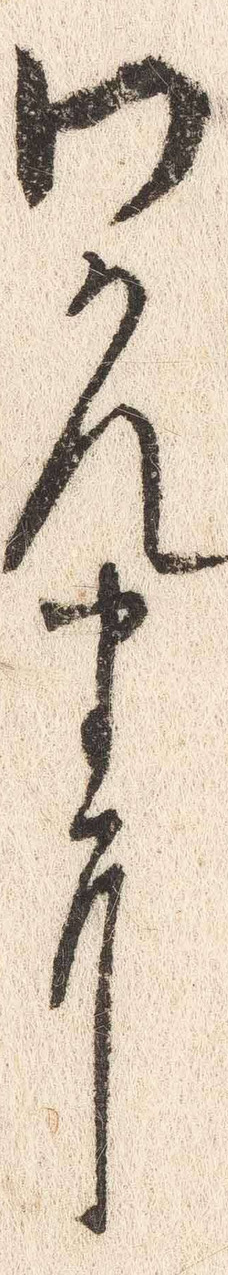わかんまに
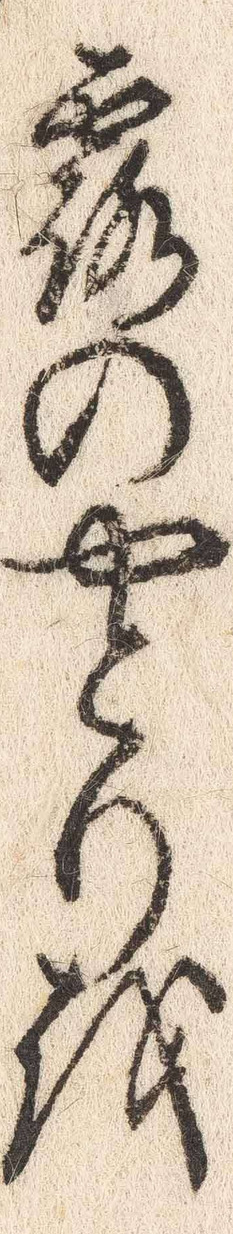露のやとりを
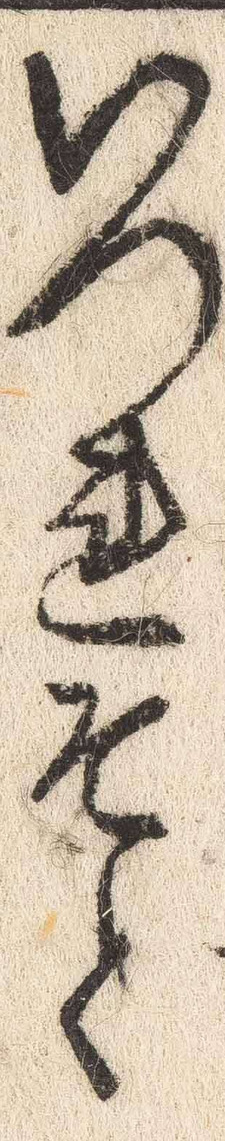いつれそと

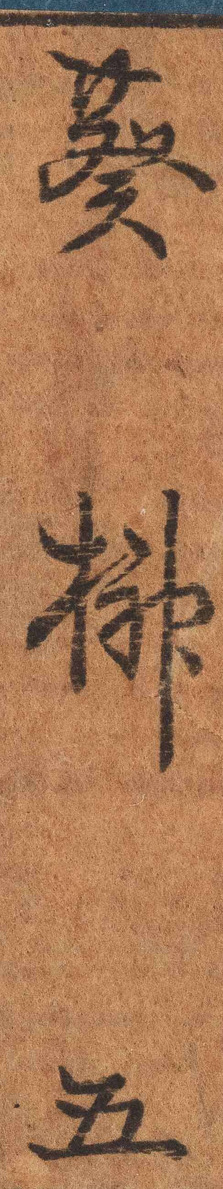葵榊五

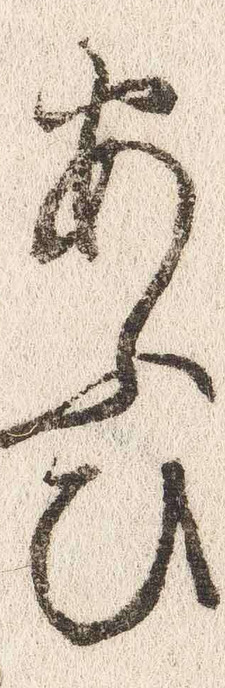あふひ
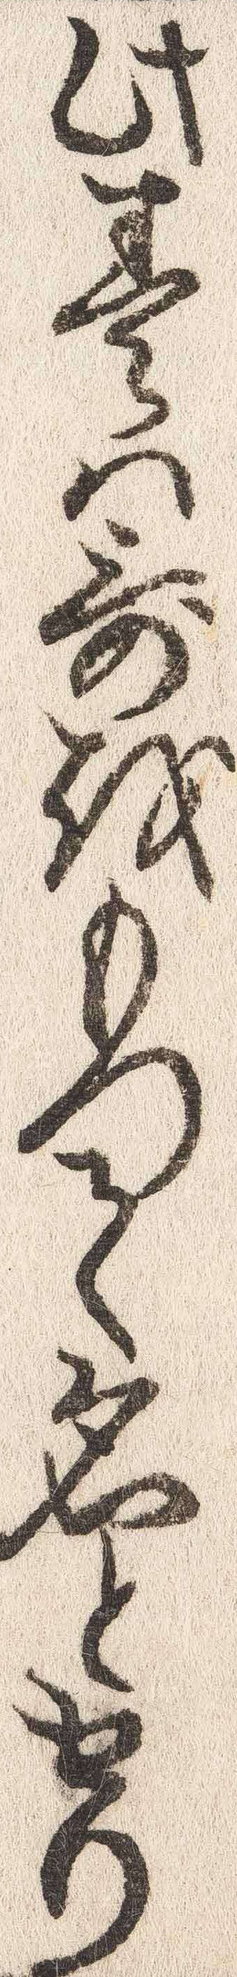此巻は歌をもつて名とせり
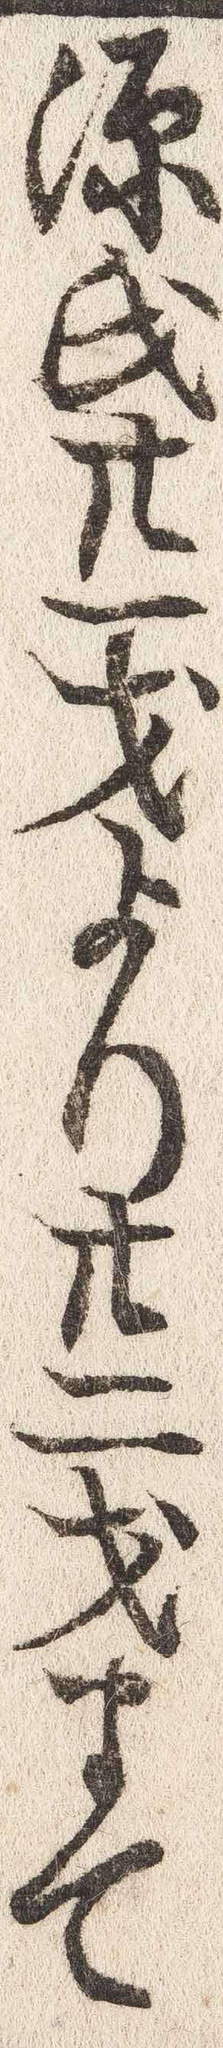源氏廿一才より廿二才まて
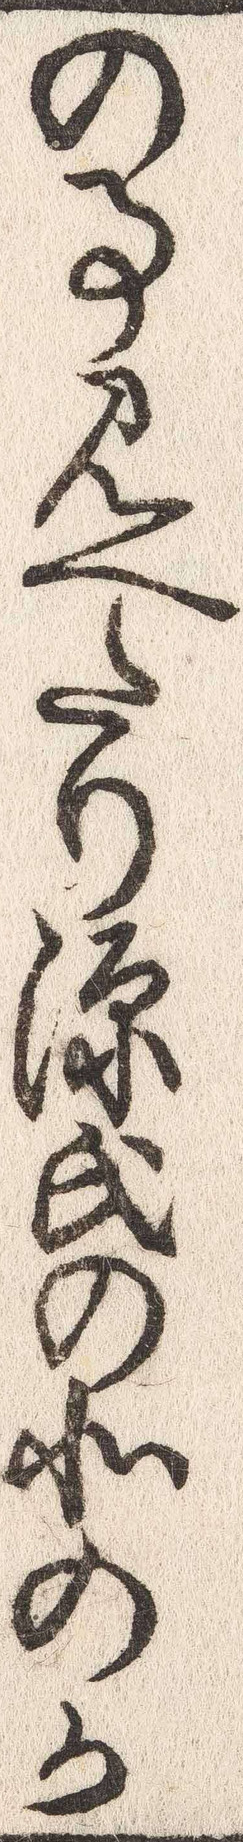の事見へたり源氏の北のか
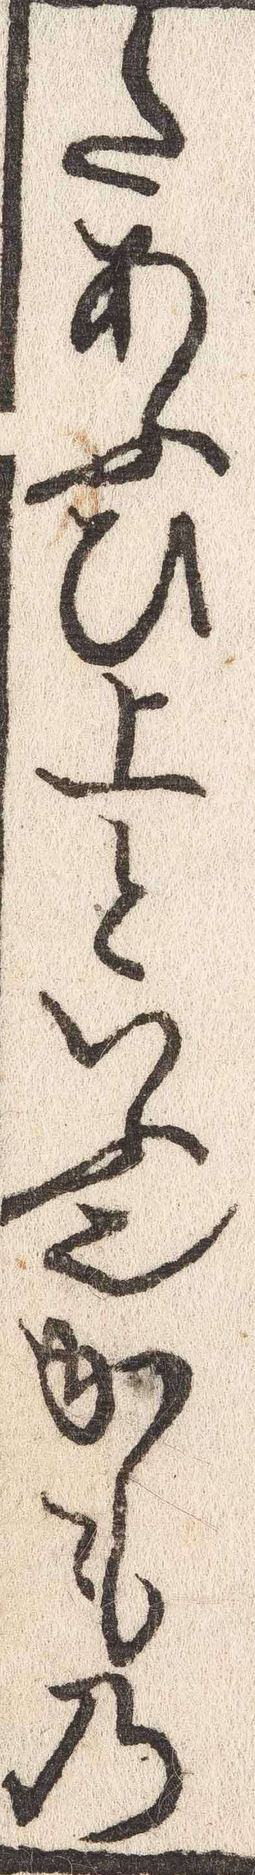たあふひ上といふ也かもの
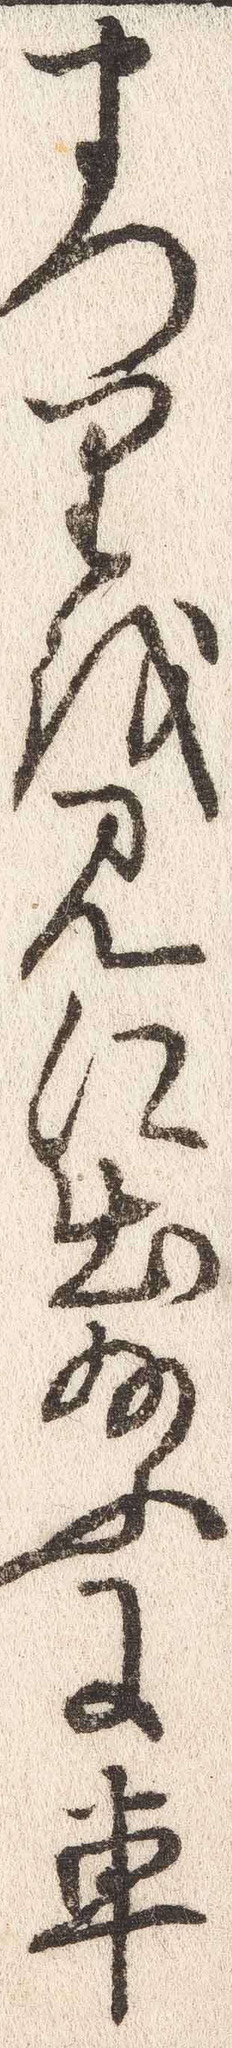まつりを見に出給ふに車
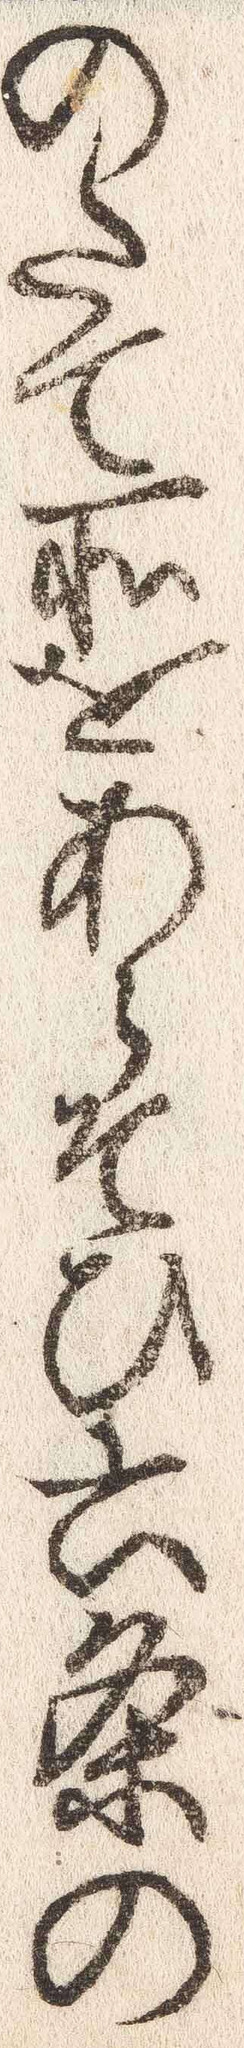のたて所をあらそひ六条の
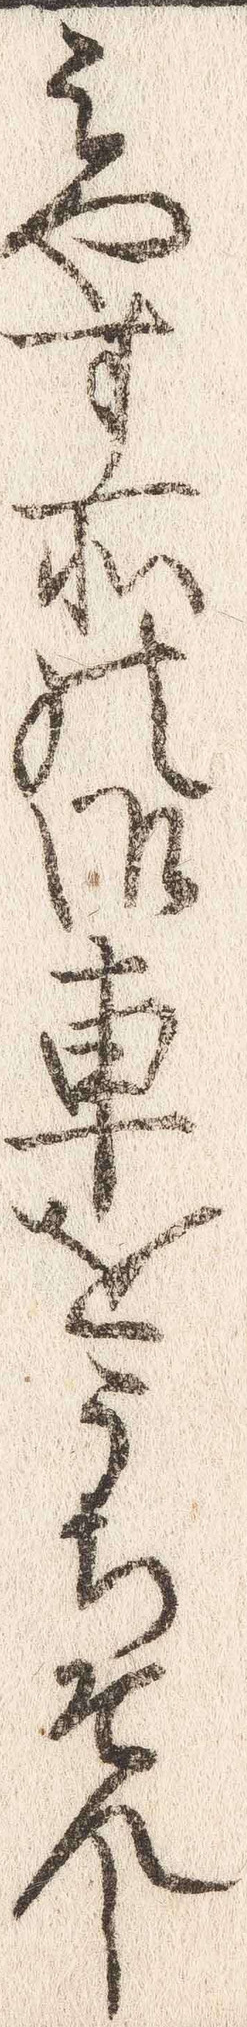みやす所の御車をうちそんし
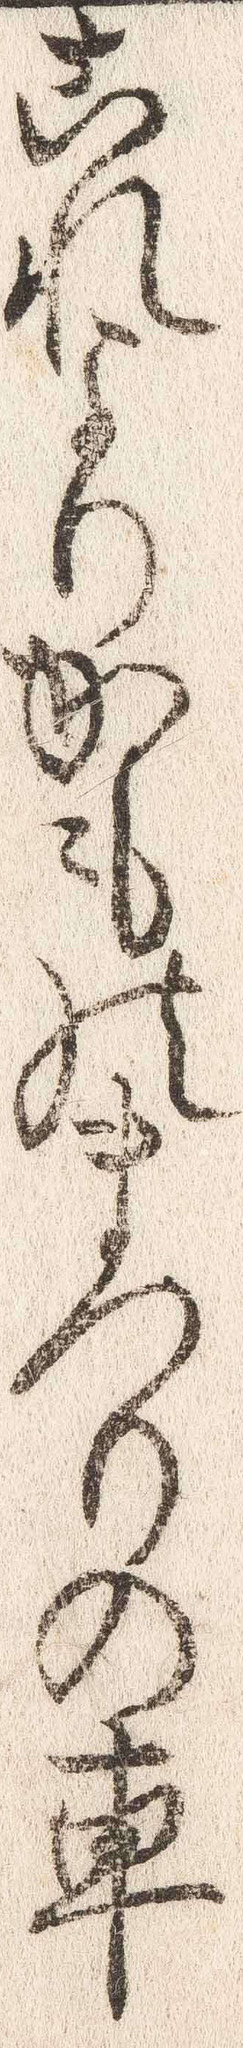これよりかものまつりの車
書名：源氏物語
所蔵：東京学芸大学附属図書館 国文学研究資料館
